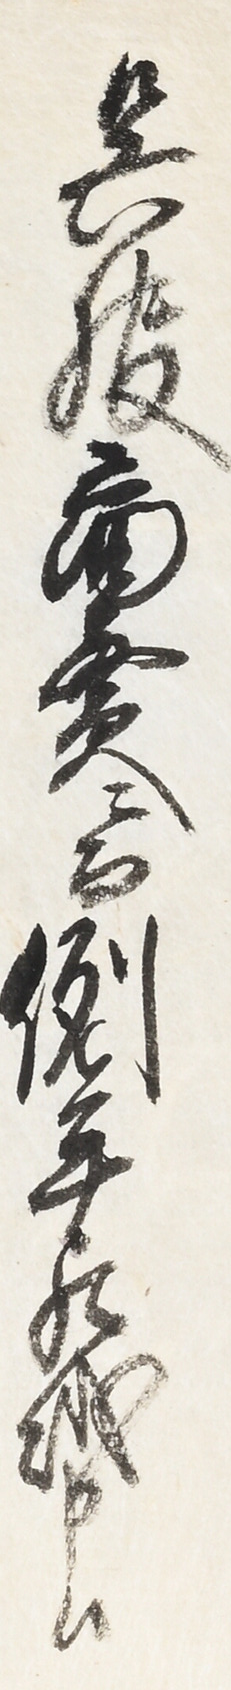呉服商売ニ而例年罷越申候
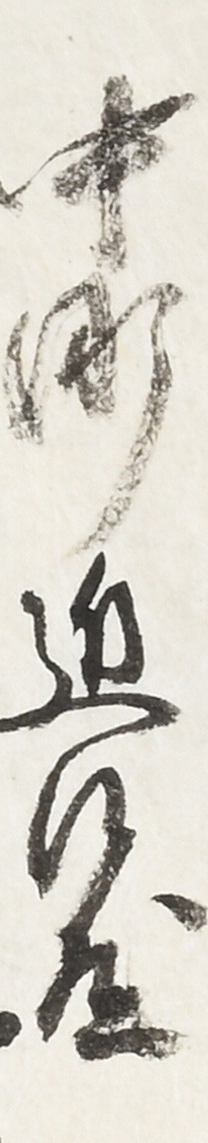中町近江屋
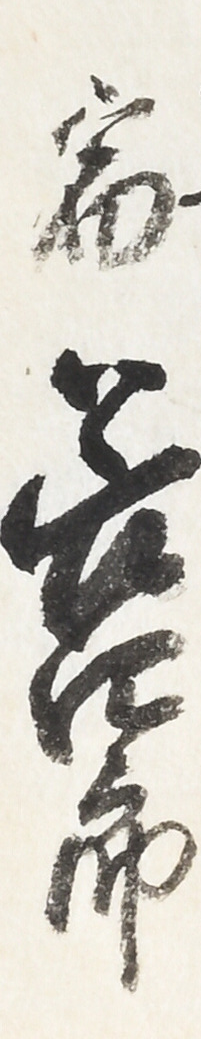宿善四郎
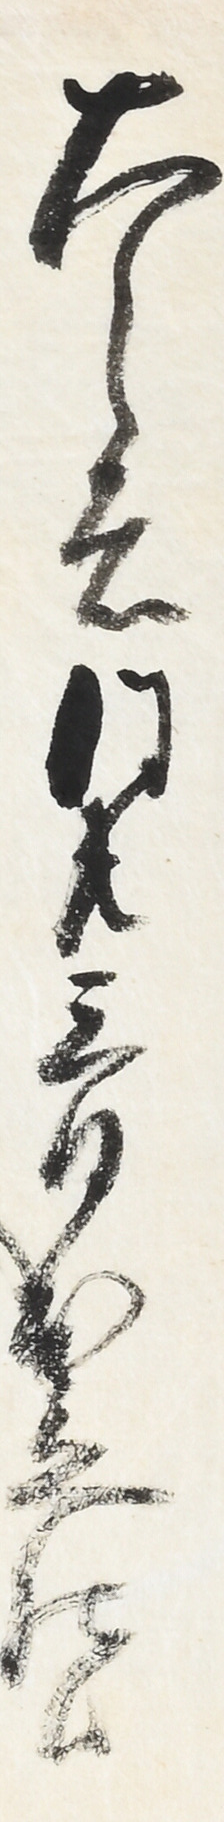右之者同廿三日出立仕候
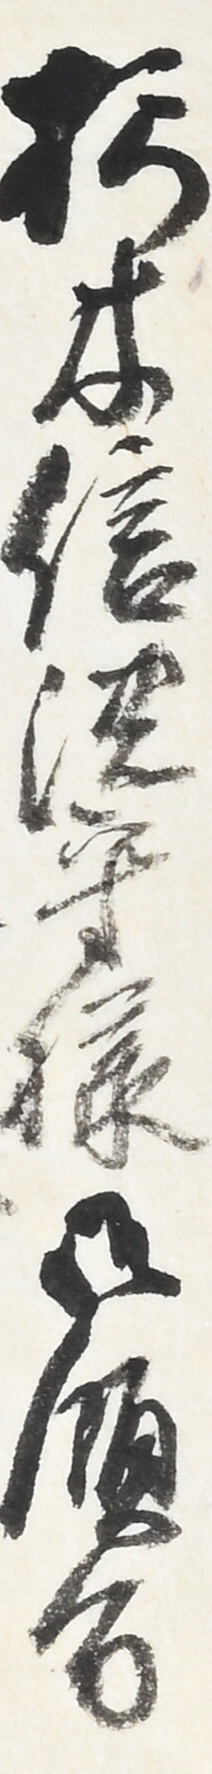朽木信濃守様御領分
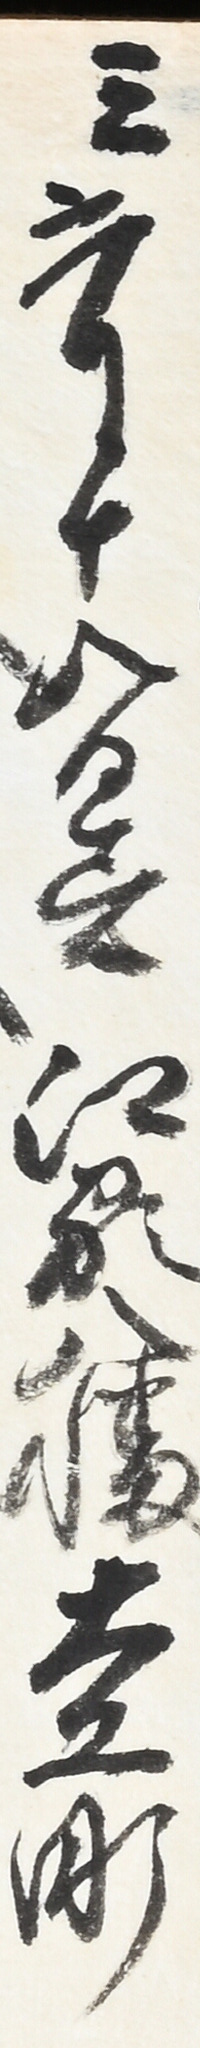壬六月十八日着江州八幡大工町
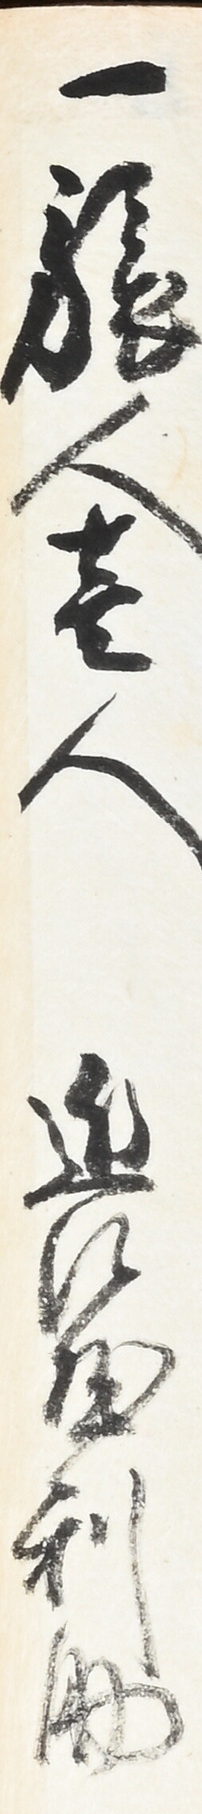一旅人壱人近江屋利助
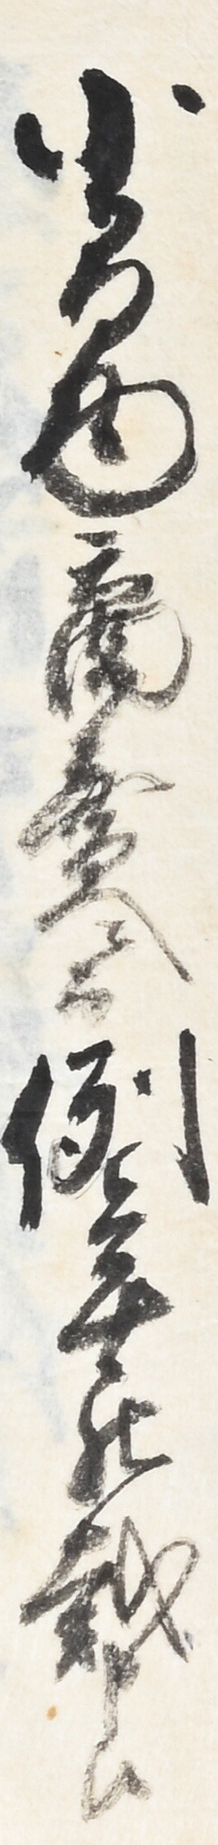呉服商売ニ而例年罷越申候
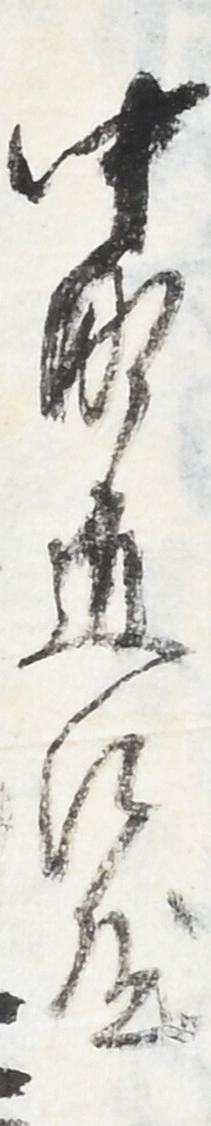中町近江屋
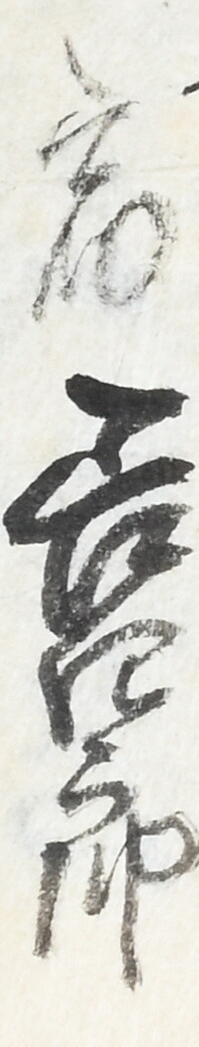宿善四郎
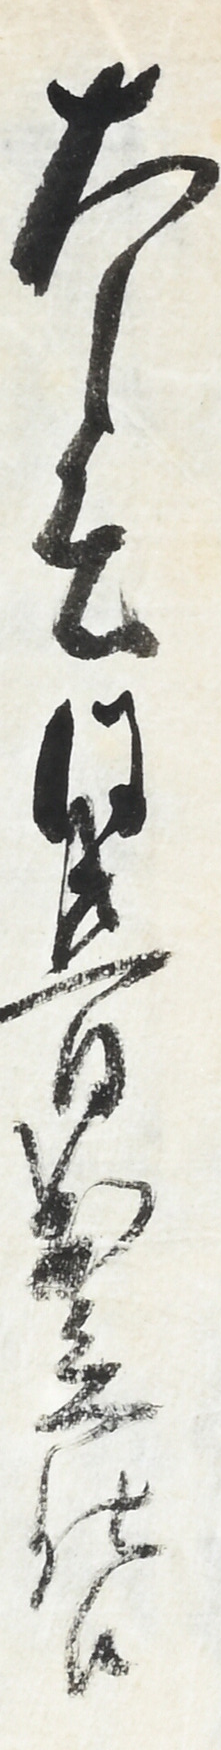右之者同廿一日出立仕候

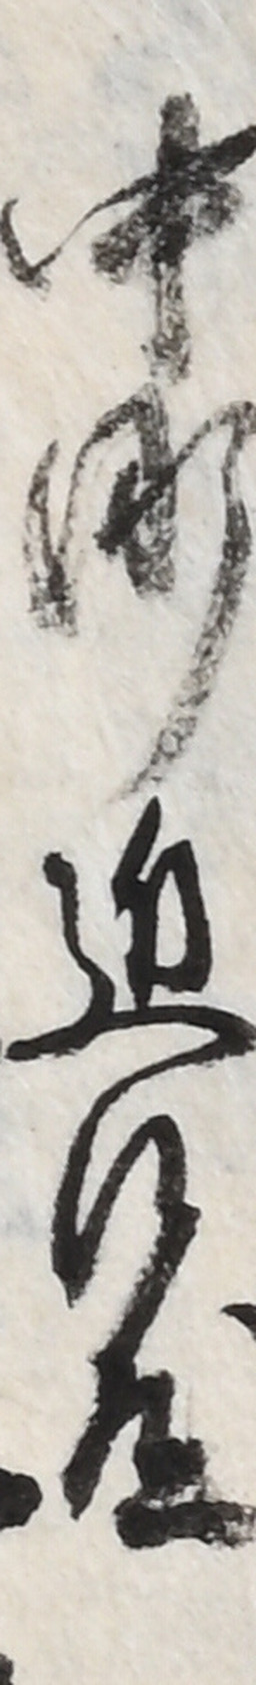中町近江屋
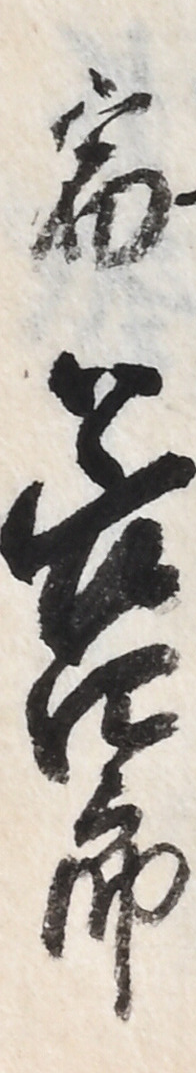宿善四郎
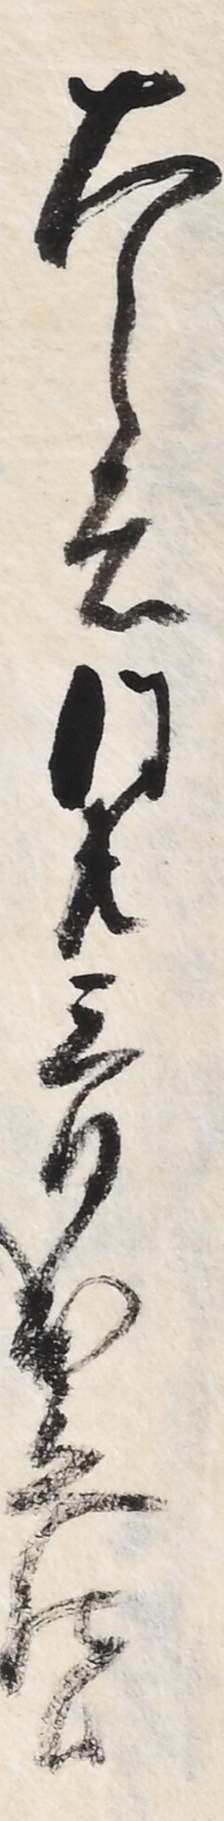右之者同廿一日出立仕候
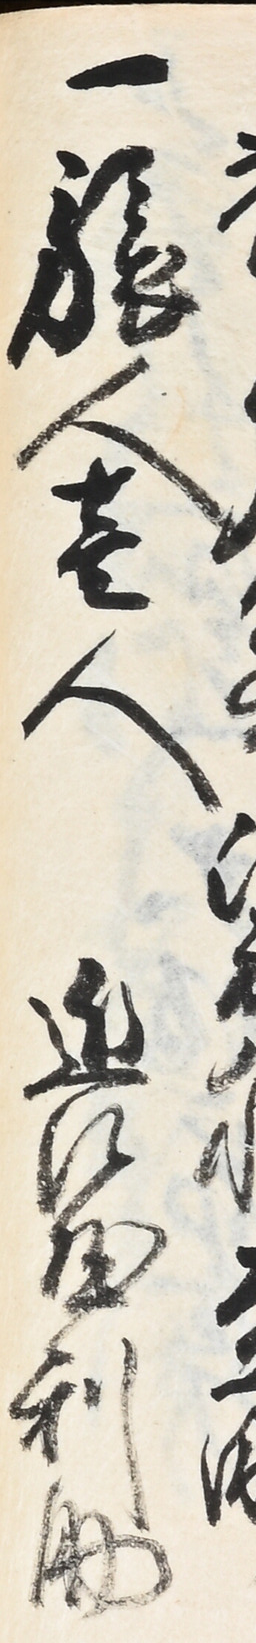一旅人壱人ぬしや太助
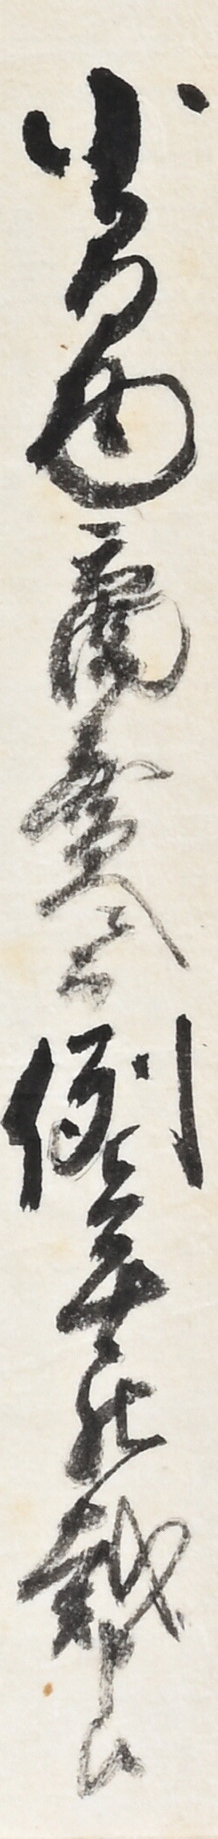小間物商売ニ而例年罷越申候
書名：旅人泊控帳
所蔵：伊那市立高遠町図書館・合同会社AMANE
